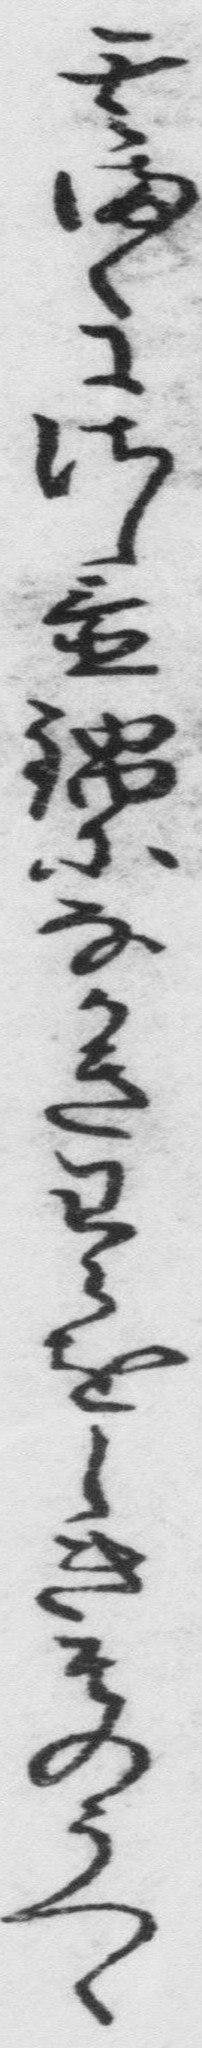其まくにさし置鍋になかきわらをしきそのうへゝ
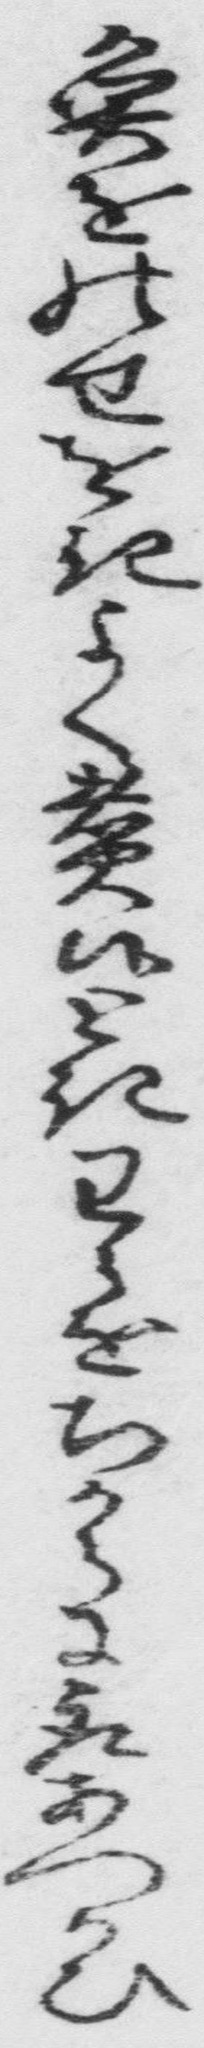魚をのせをきよく煮候ときわらをちからに取あつかひ
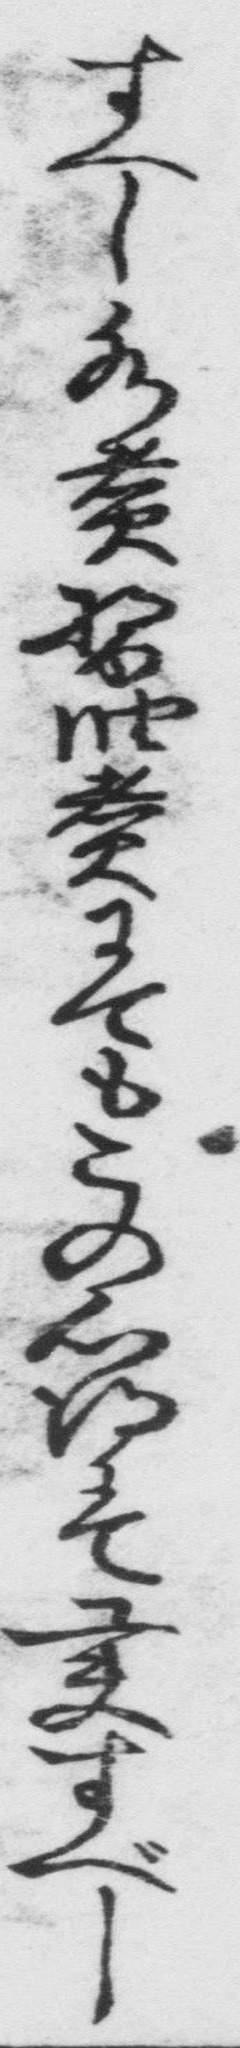すへし水煮醤油煮にてもこの心得にて工夫すべし
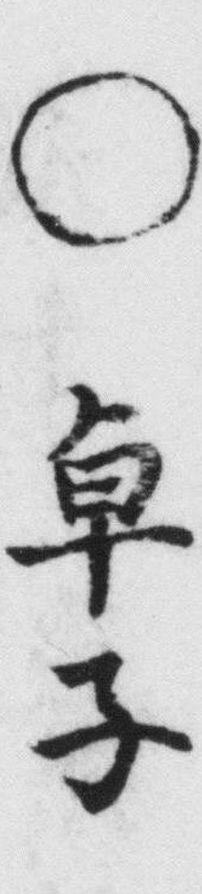○卓子
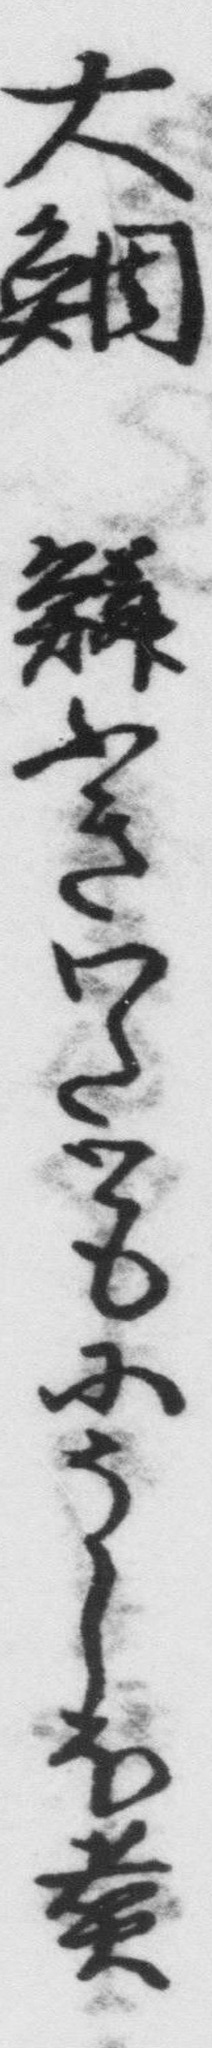大鯛鱗ふきわたともにうしほ煮
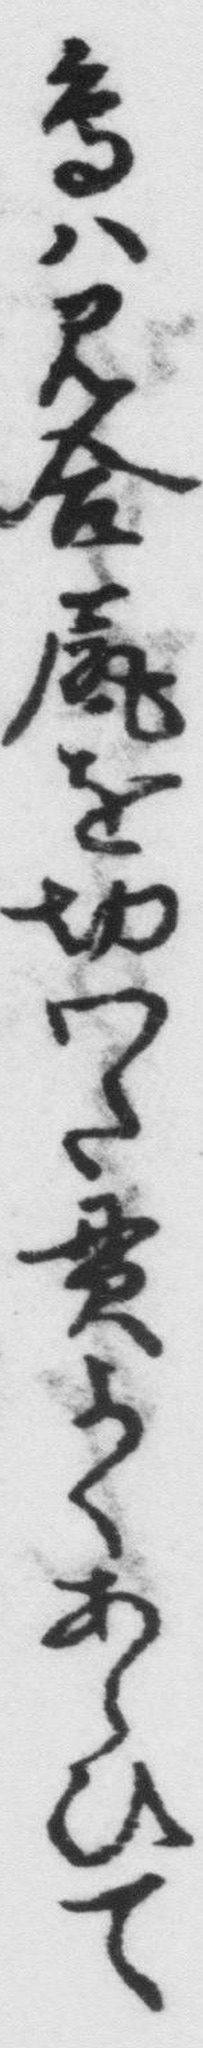金鶏鳥は見合尻を切わた貫よくあらひて
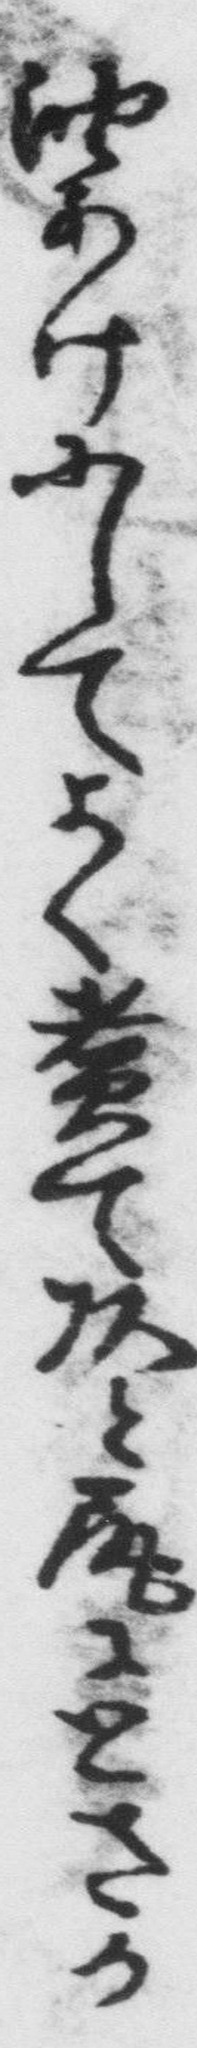油あけにしてよく煮て頭と尻にとさか
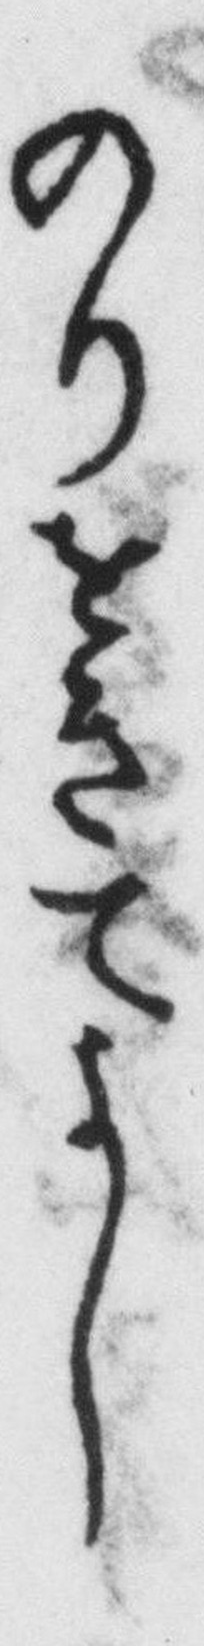のりをきてよし
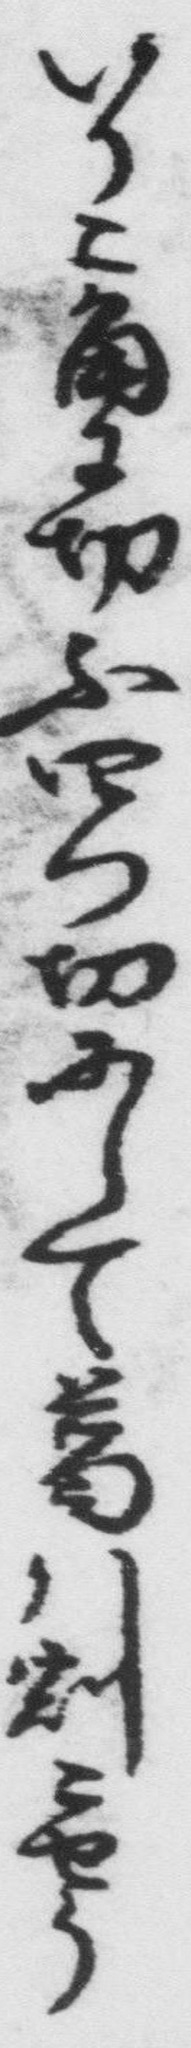牛肉いりこ角に切ふ四つ切にして葛引割こせう
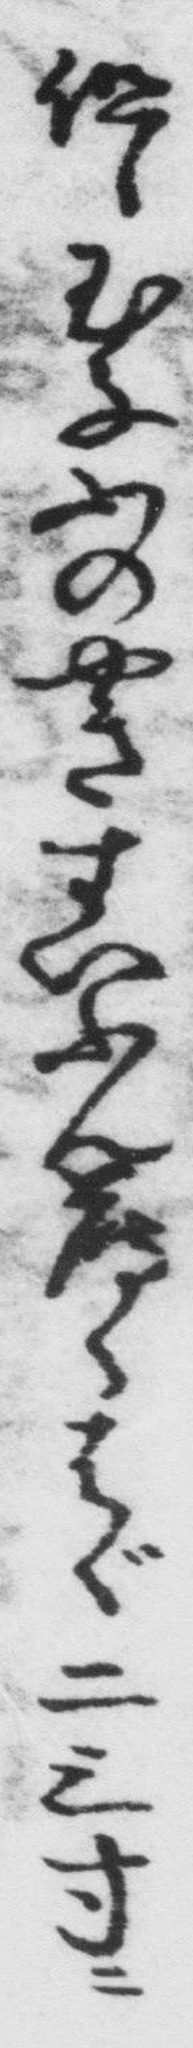但し玉子ふのやきすいふん薄くはぐ二三寸に
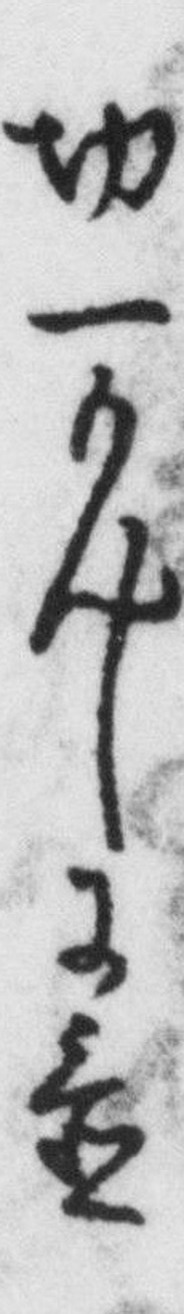切一もんしに置

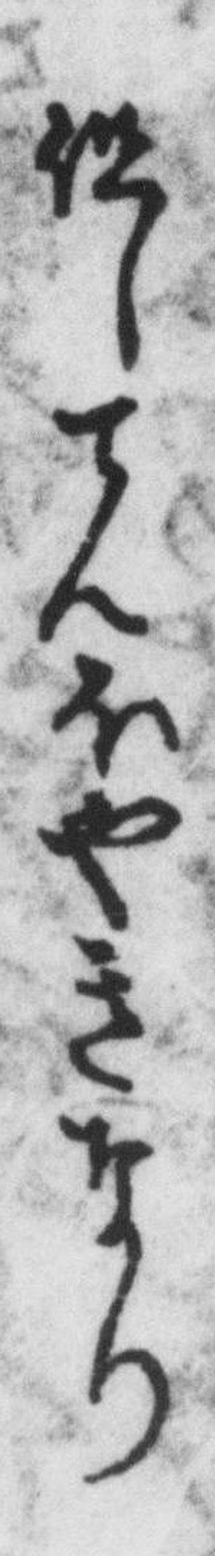但してんほやきなり
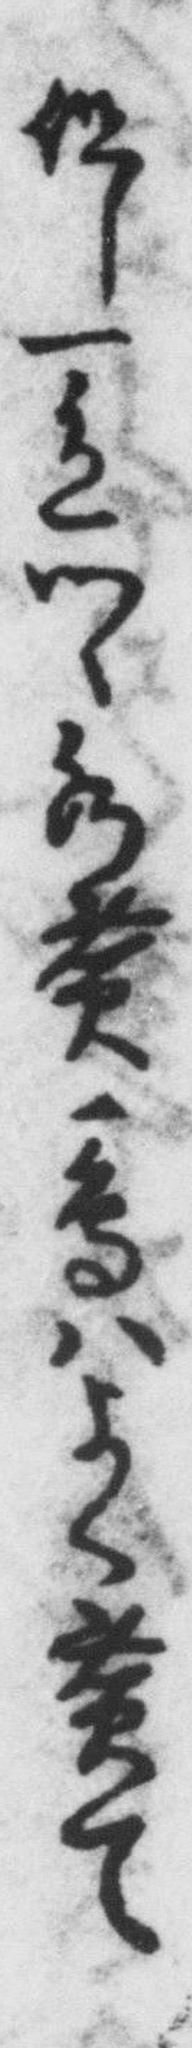但し一色つゝ水煮▲鳥はよく煮て
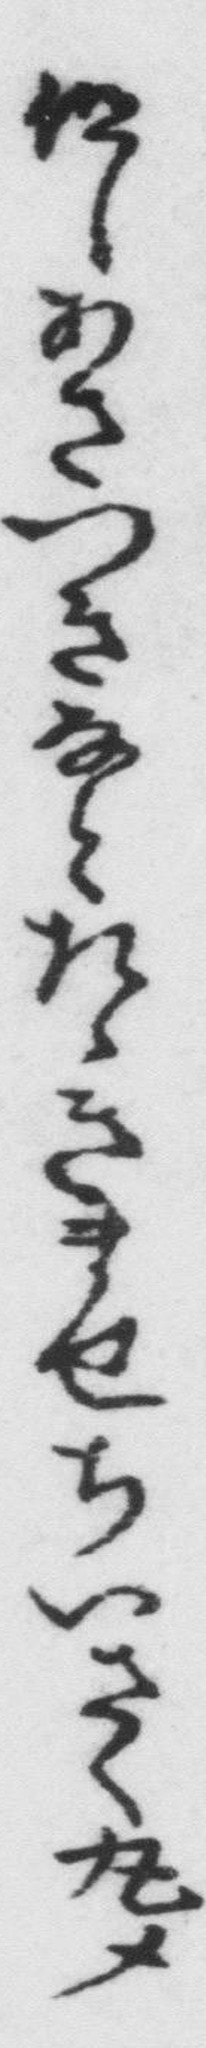但しあさつきなとたゝきませちいさく丸め
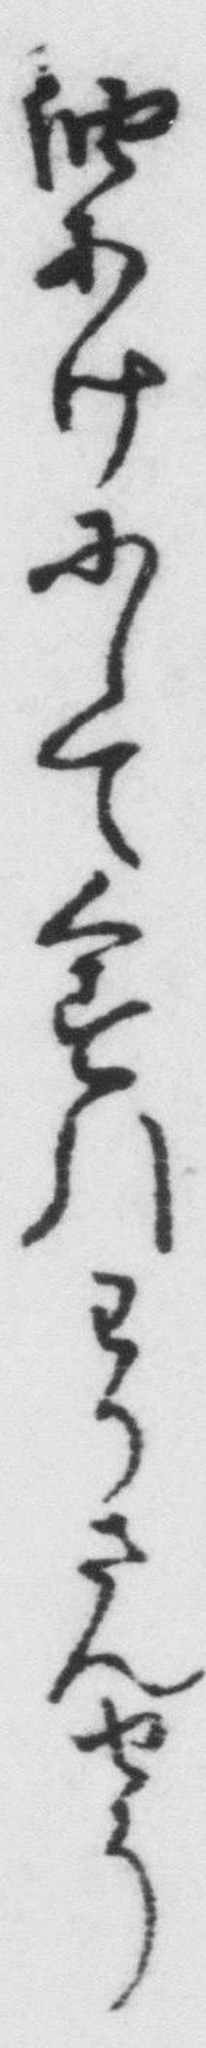油あけにしてくす引わりさんせう
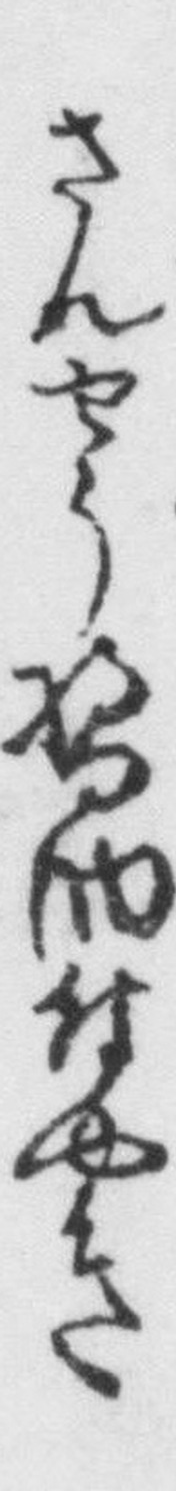さんせう醤油付やき
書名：卓子料理仕様
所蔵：大阪府立大学学術情報センター 国文学研究資料館
